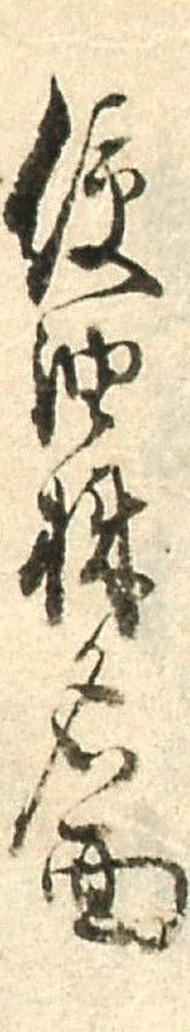絞油株名面

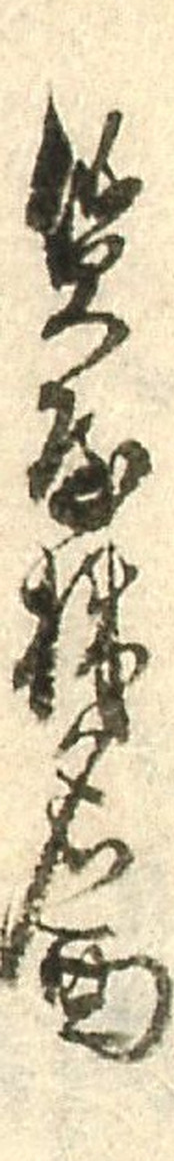質屋株名面

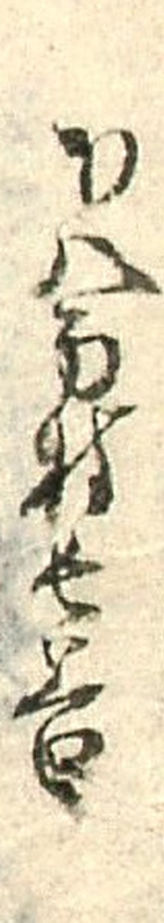一下八万村長兵八
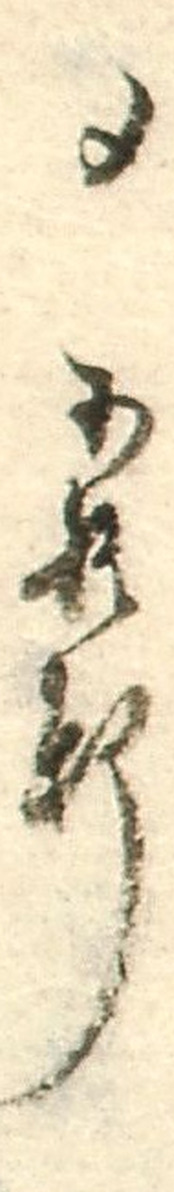〆五十軒
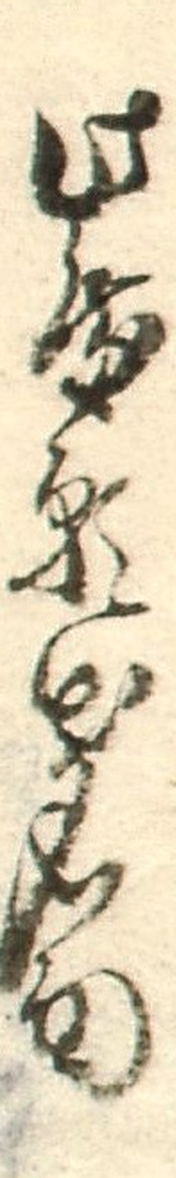此度願出名面

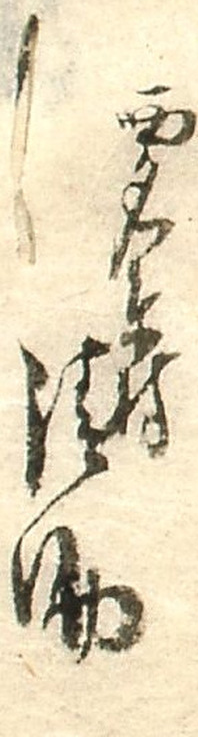一西名東村清助

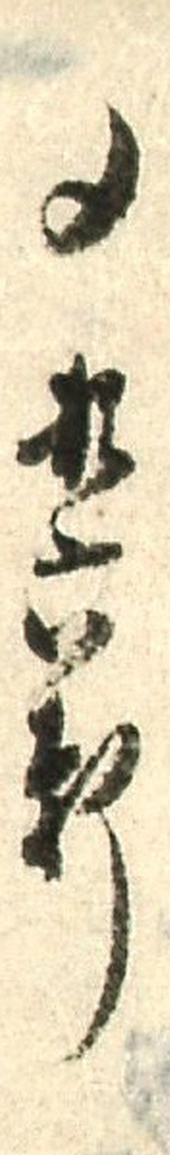〆十六軒
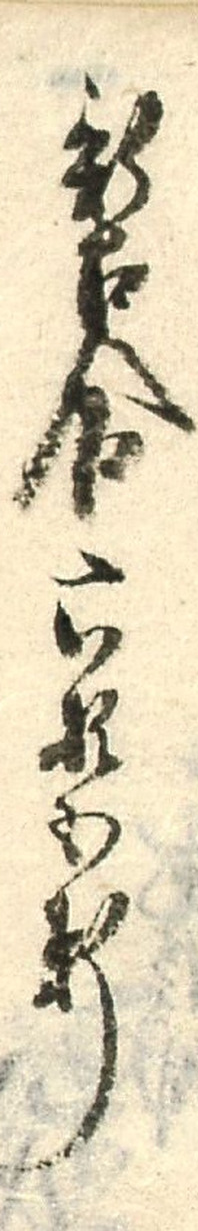新古合六十五軒
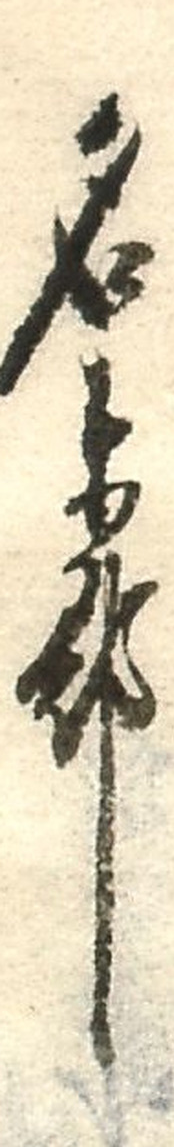名東郡
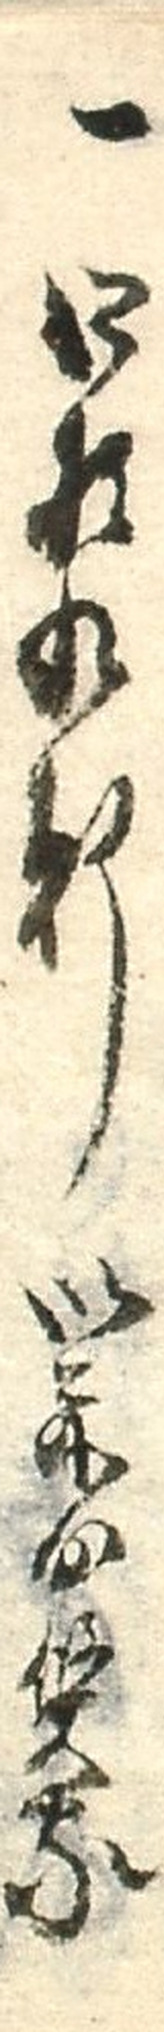一四十九軒以前より質家
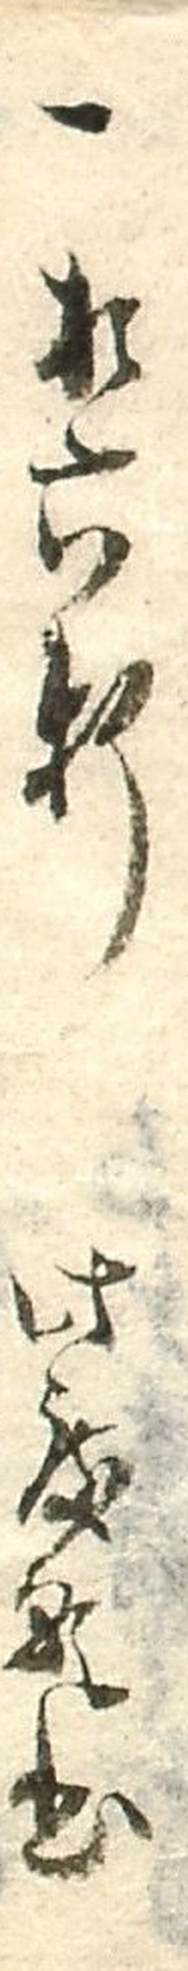一十六軒此度願出
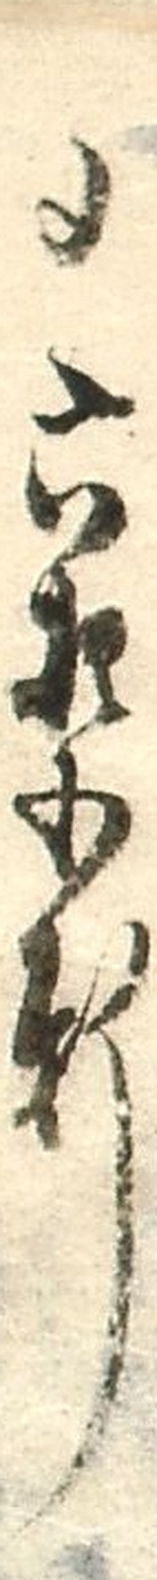〆六十五軒
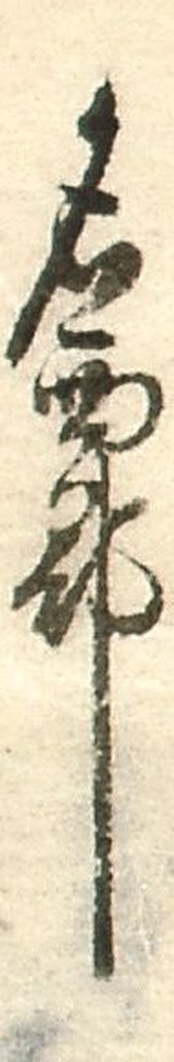名西郡
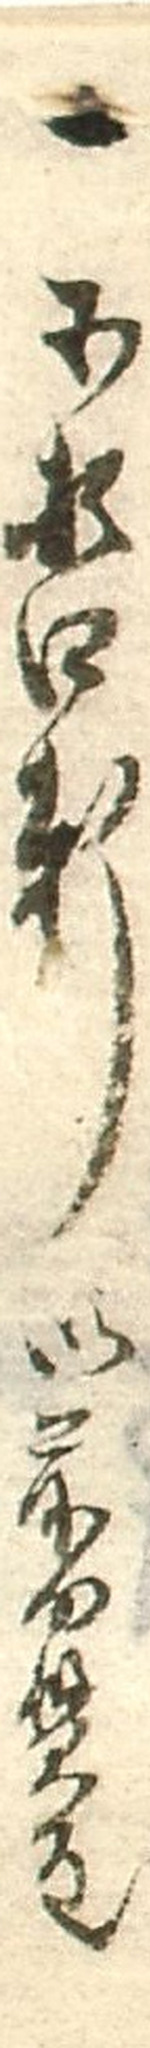一五十四軒以前より質屋
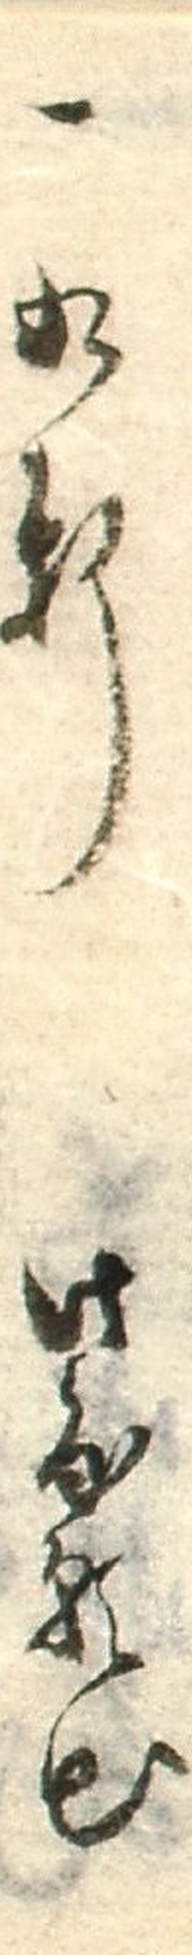一九軒此度願出
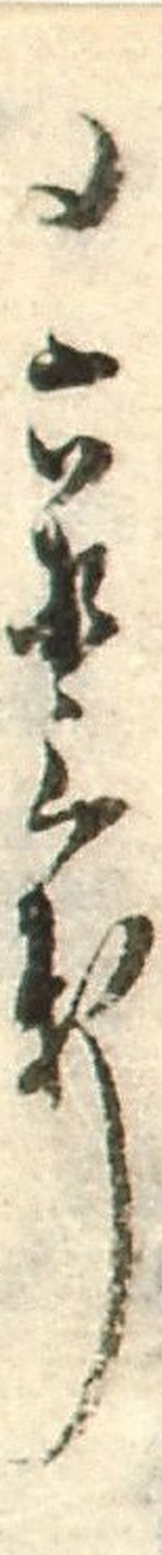〆六十三軒
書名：郷酒株絞油株質屋株御取窮郡中名面帳並諸郡株数相改帳
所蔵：鳴門教育大学 Naruto University of Education
